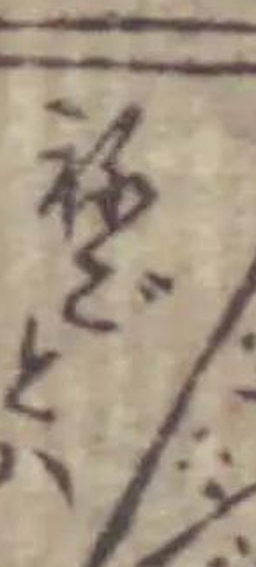ねごとは
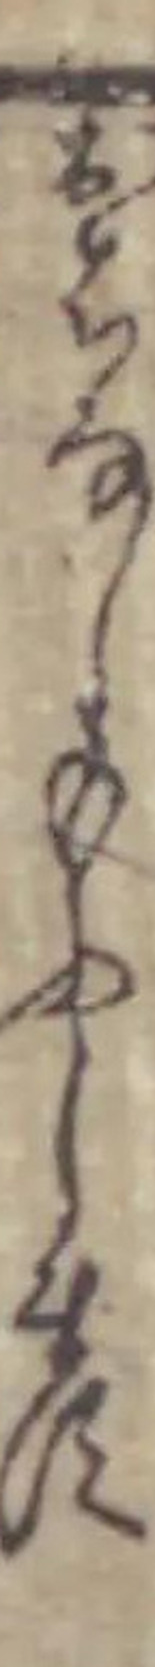おはなしもふします
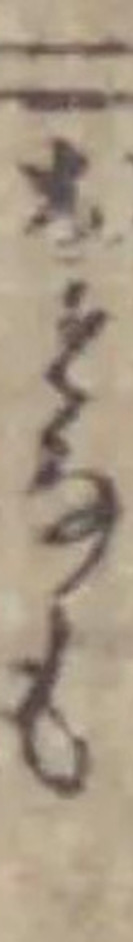おとなも
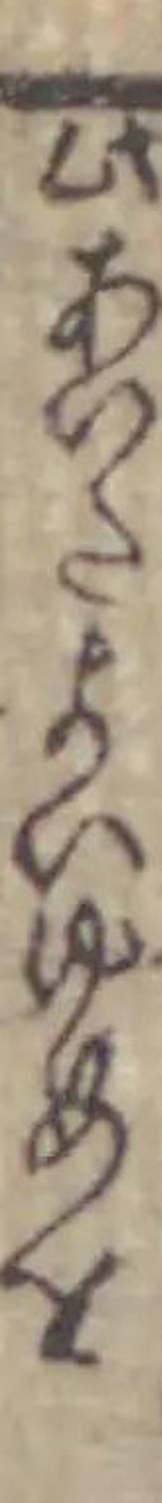此あいたよいゆめを
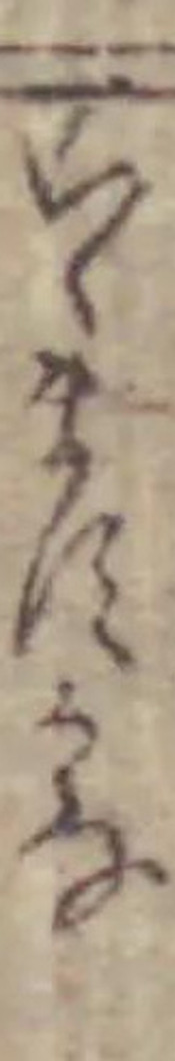いゝますかな
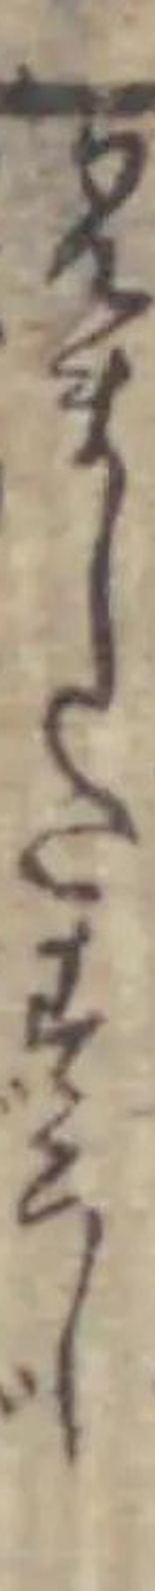見ましたすこし
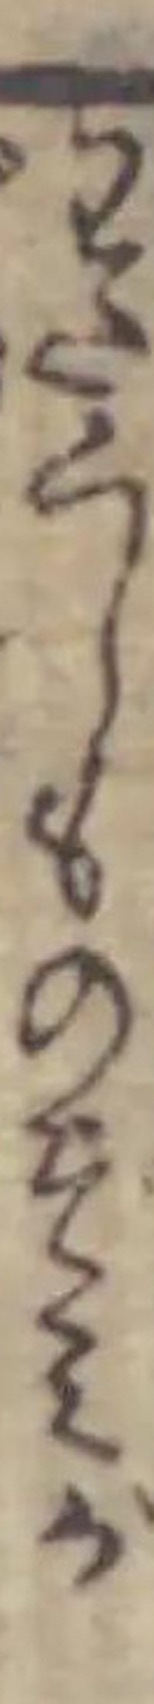わたくしものぞみが
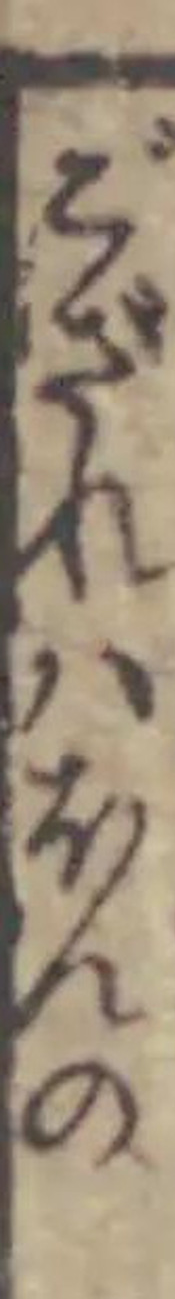ござれはほんの
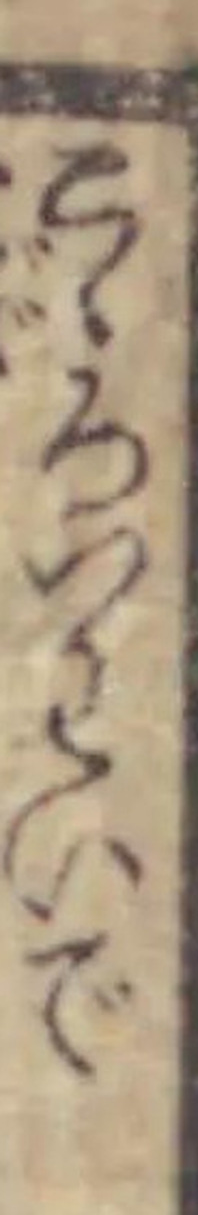こゝろいわいで
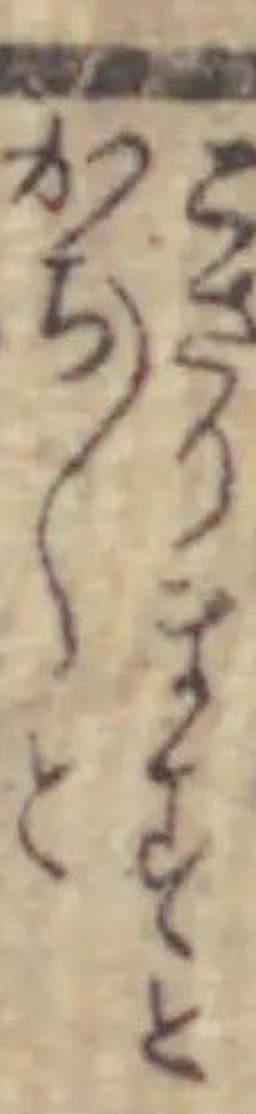かち〳〵と
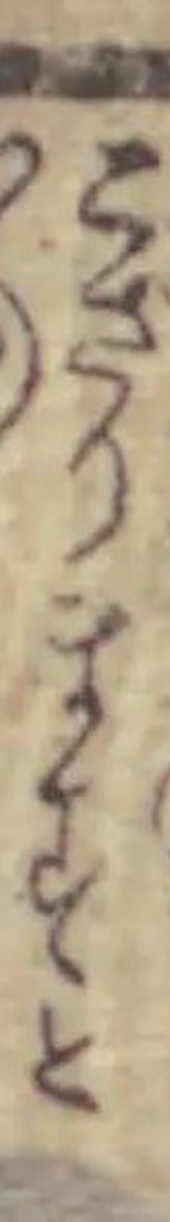ござりますと
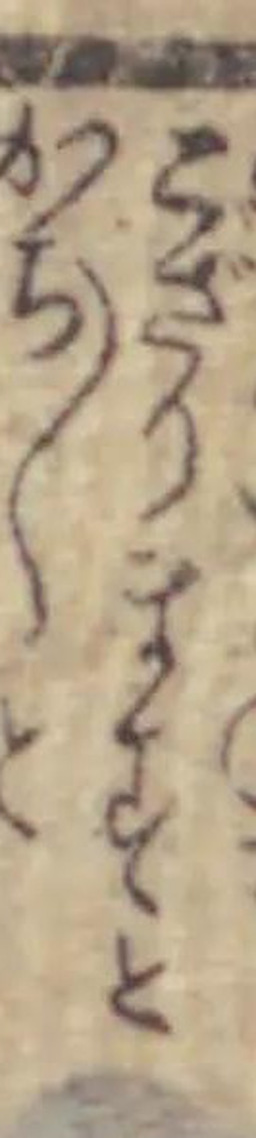かち〳〵と
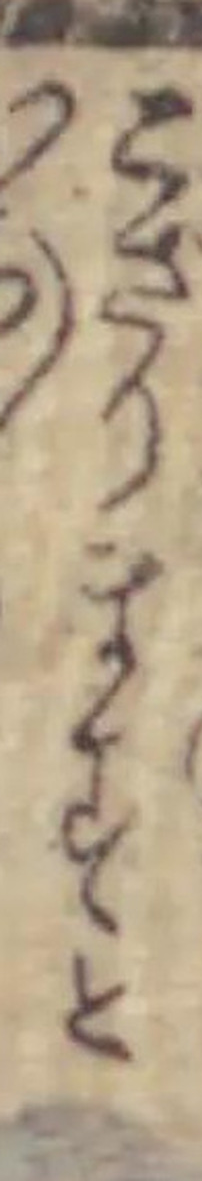ござりますと
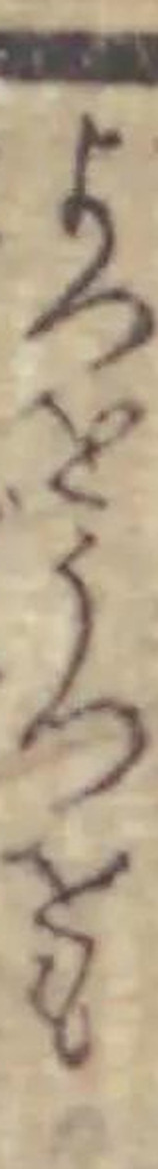よつをうつをも
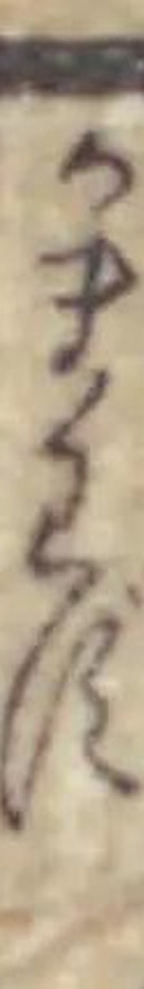かまわず
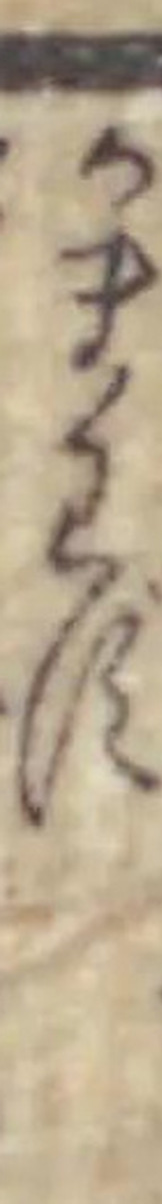かまわず
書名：間違月夜鍋 2巻
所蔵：国立国会図書館 National Diet Library, JAPAN
